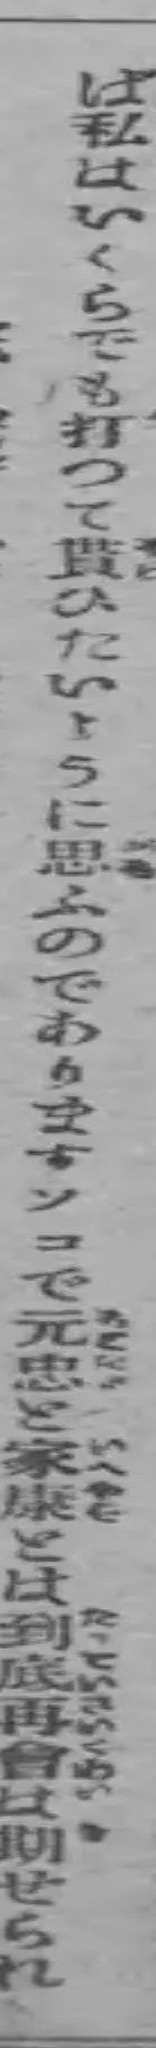ば私はいくらでも打つて貰ひたいように思ふのでありますソコで元忠と家康とは到底再会は期せられ
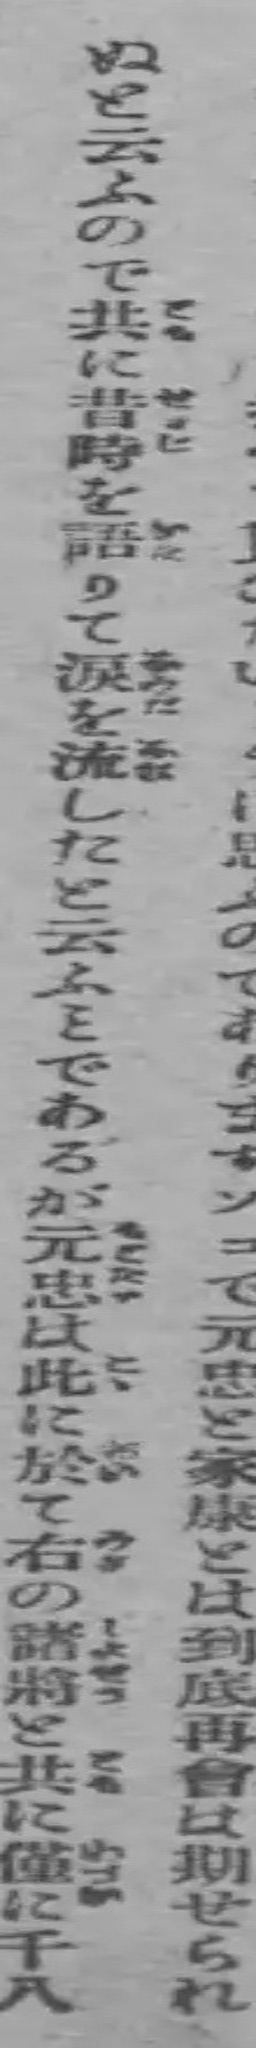ぬと云ふので共に昔時を語りて涙を流したと云ふことであるが元忠は此に於て右の諸将と共に僅に千八
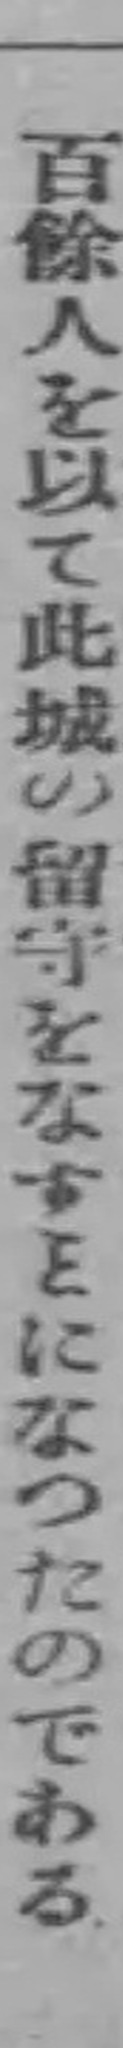百余人を以て此城の留守をなすことになつたのである
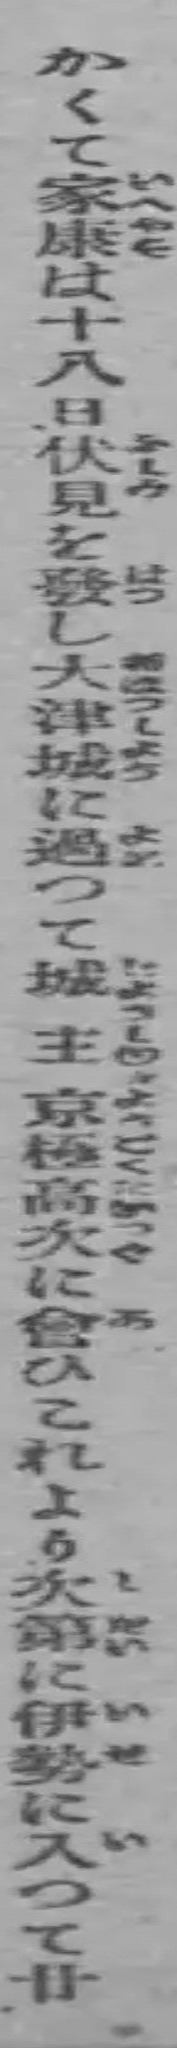京極高次かくて家康は十八日伏見を発し大津城に過つて城主京極高次に会ひこれより次第に伊勢に入つて廿
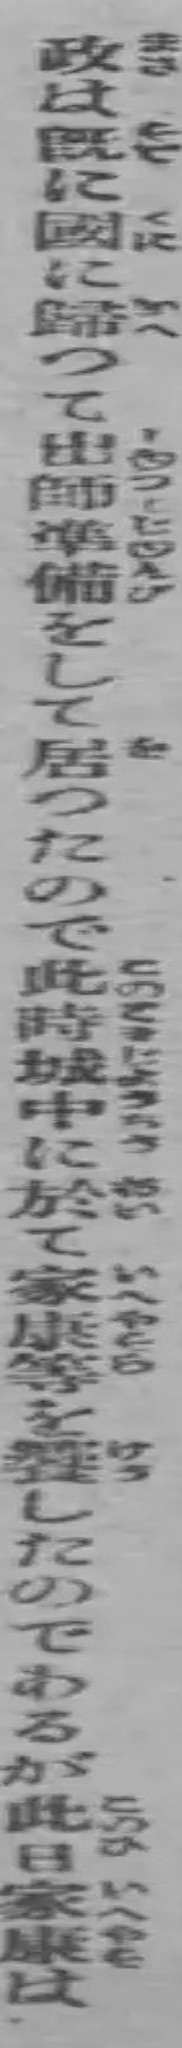政は既に国に帰つて出師準備をして居つたので此時城中に於て家康等を饗したのであるが此日家康は
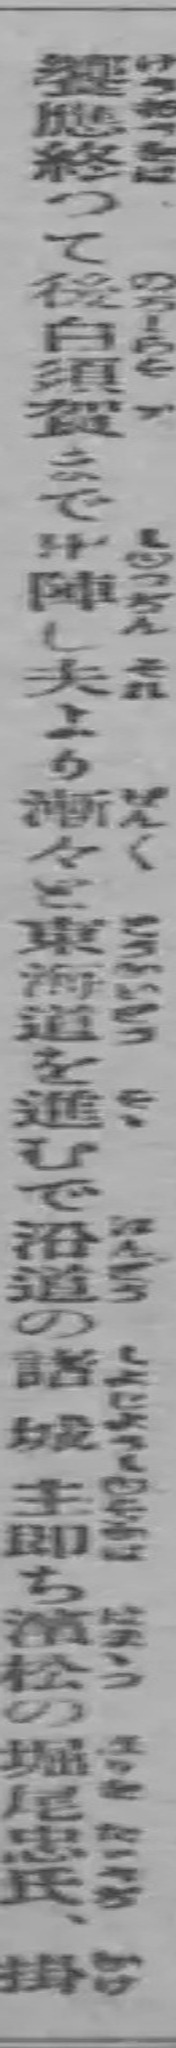饗応終つて後白須賀まで出陣し夫より漸々と東海道を進むで沿道の諸城主即ち浜松の堀尾忠氏、掛
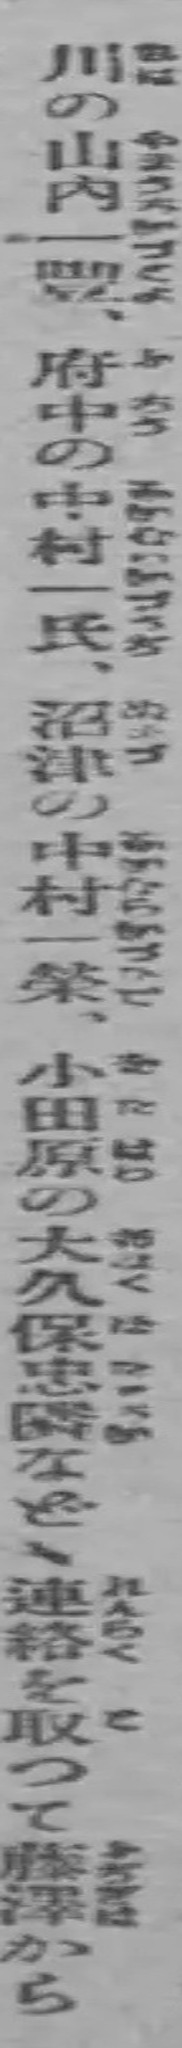川の山内一豊、府中の中村一氏、沼津の中村一栄、小田原の大久保忠隣などゝ連絡を取つて藤沢から
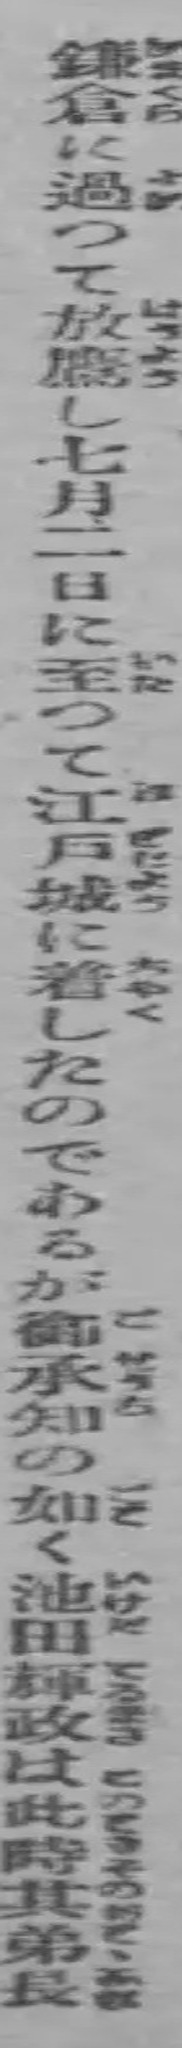輝政の従軍鎌倉に過つて放鷹し七月二日に至つて江戸城に着したのであるが御承知の如く池田輝政は此時其弟長
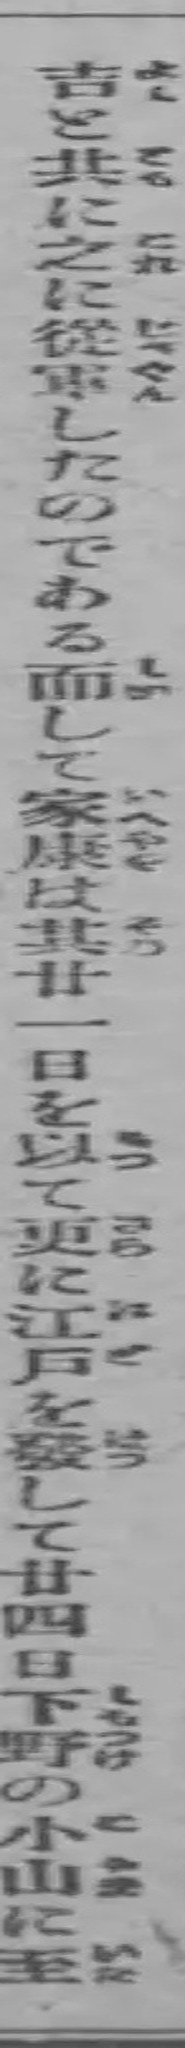吉と共に之に従軍したのである而して家康は其廿一日を以て更に江戸を発して廿四日下野の小山に至
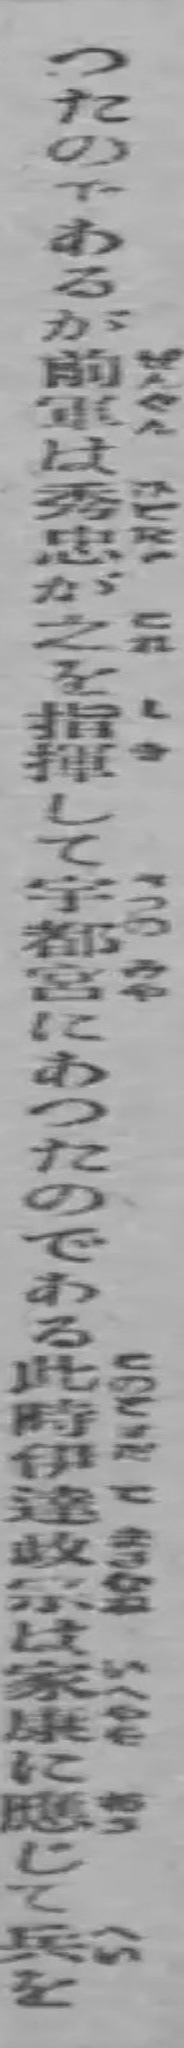つたのであるが前軍は秀忠が之を指揮して宇都宮にあつたのである此時伊達政宗は家康に応じて兵を
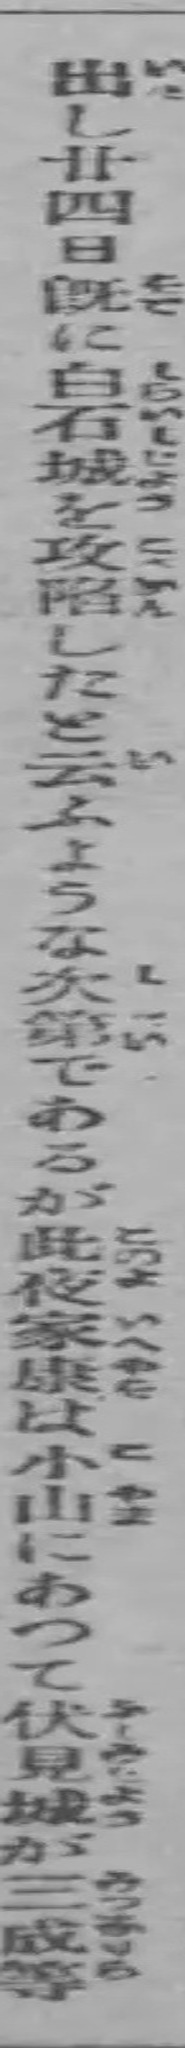出し廿四日既に白石城を攻陥したと云ふような次第であるが此夜家康は小山にあつて伏見城が三成等
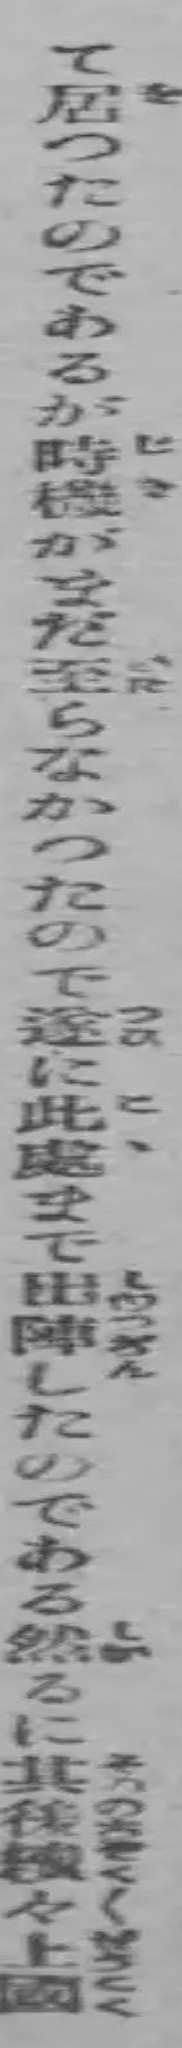警報に接すて居つたのであるが時機がまだ至らなかつたので遂に此処まで出陣したのである然るに其後続々上国
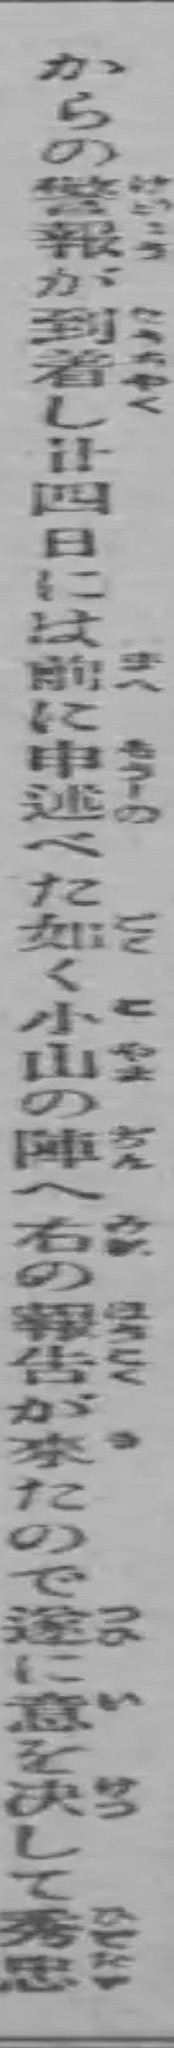からの警報が到着し廿四日には前に申述べた如く小山の陣へ右の報告が来たので遂に意を決して秀忠
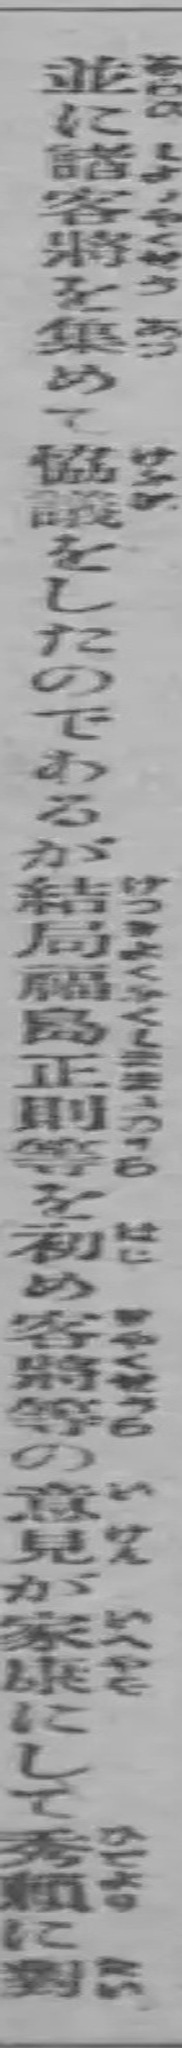並に諸客将を集めて協議をしたのであるが結局福島正則等を初め客将等の意見が家康にして秀頼に対
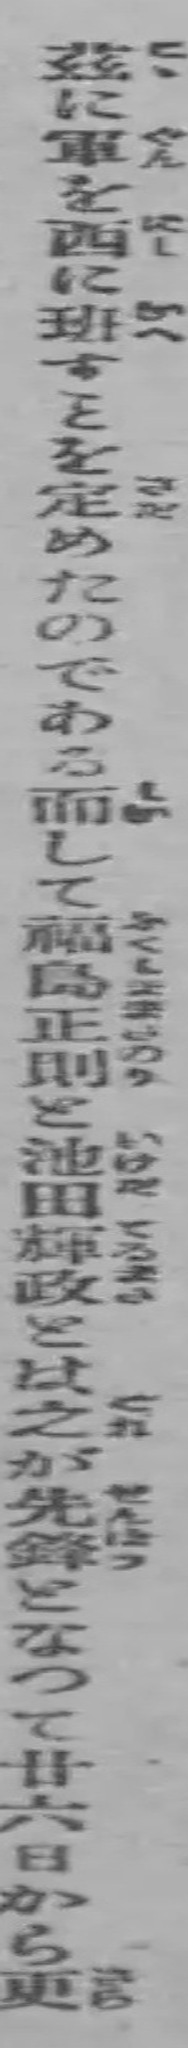茲に軍を西に班すことを定めたのである而して福島正則と池田輝政とは之が先鋒となつて廿六日から更
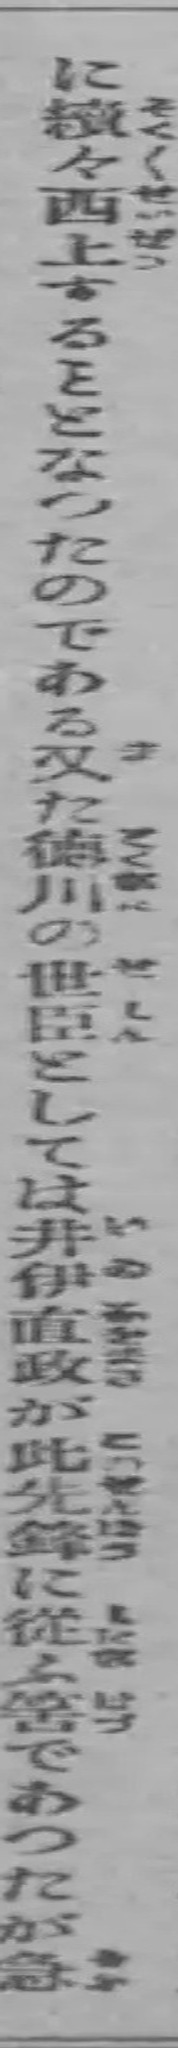に続々西上することとなつたのである又た徳川の世臣としては井伊直正が此先鋒に従ふ筈であつたが急
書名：豊橋市史談
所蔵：国立国会図書館 National Diet Library, JAPAN
